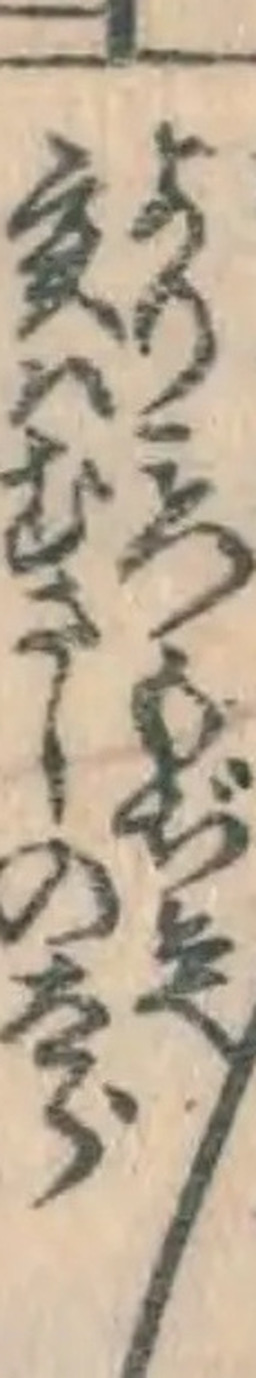実はむさしの太郎
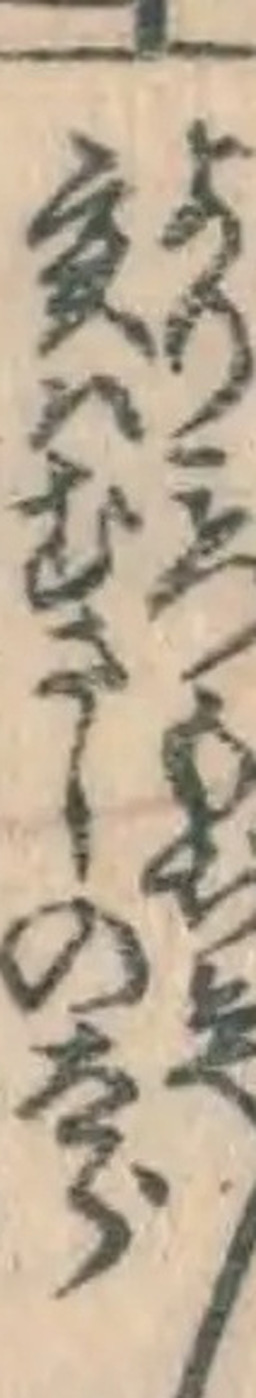実はむさしの太郎
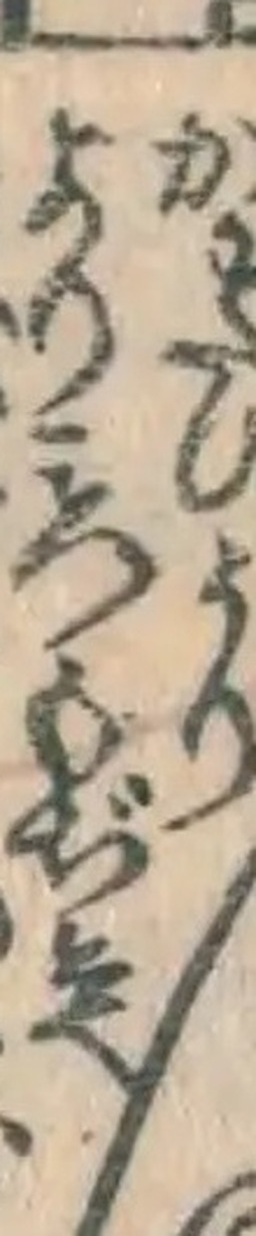よりみつもぢ兵へ
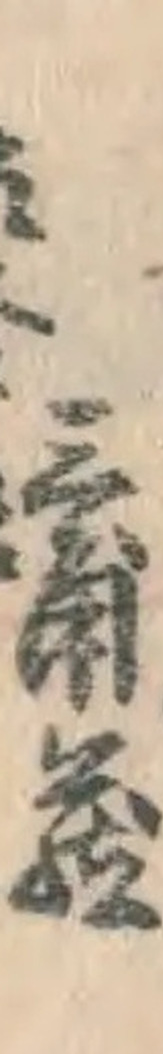三甫蔵
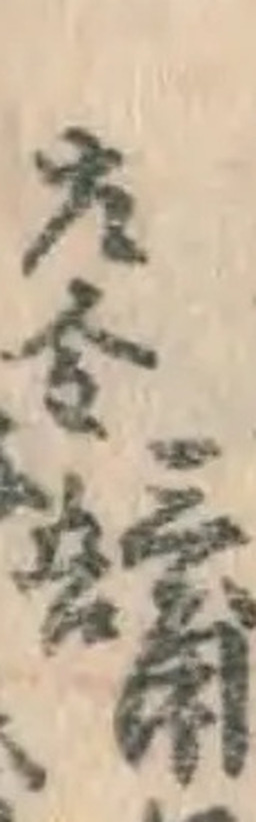左金吾
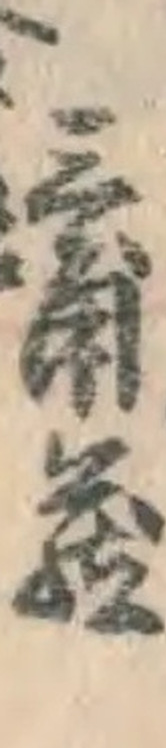三甫蔵
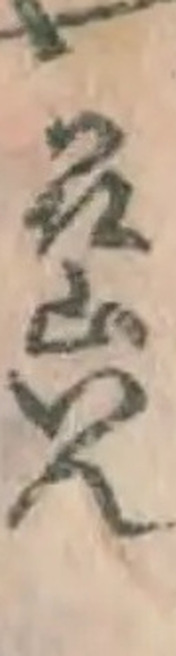花山いん
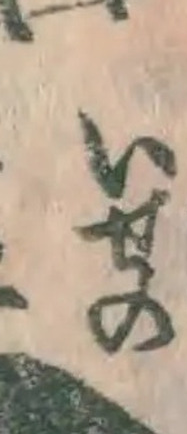いせの
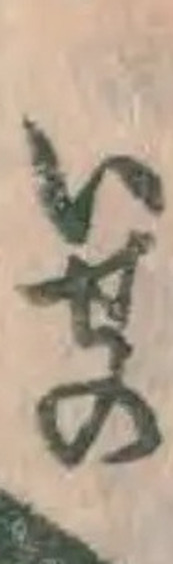いせの
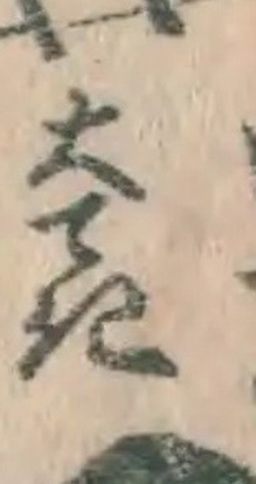大てき
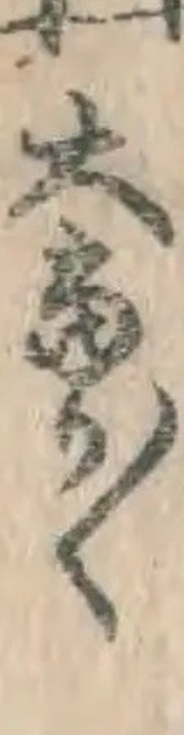大当り〳〵

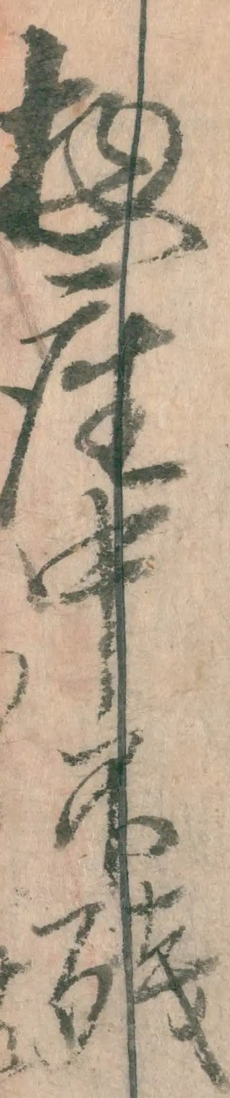惣座中不残
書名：四天王宿直着綿
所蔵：国立国会図書館 National Diet Library, JAPAN
